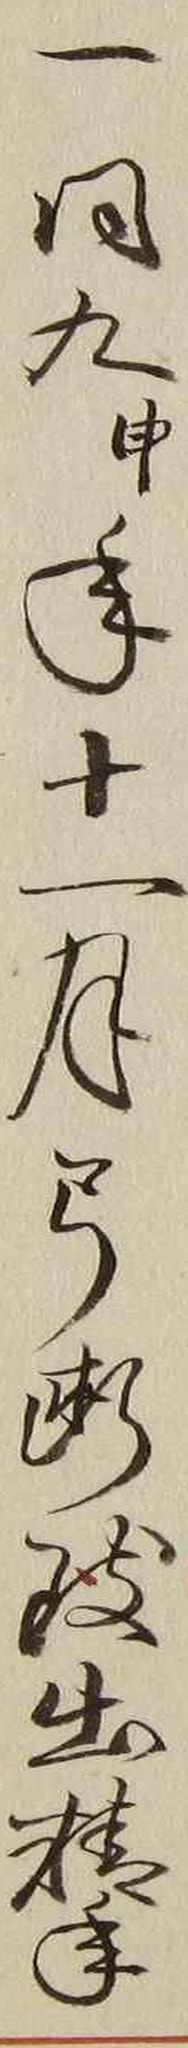一同九申年十一月弓術出精年
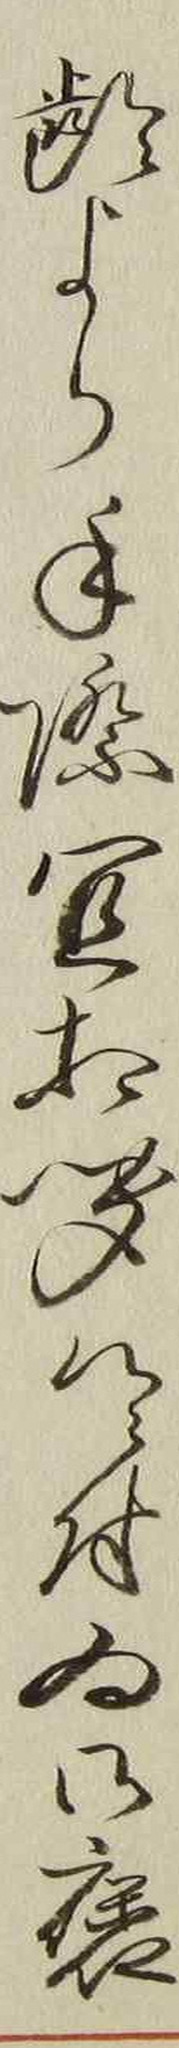齢より手際宜相聞候ニ付為御褒
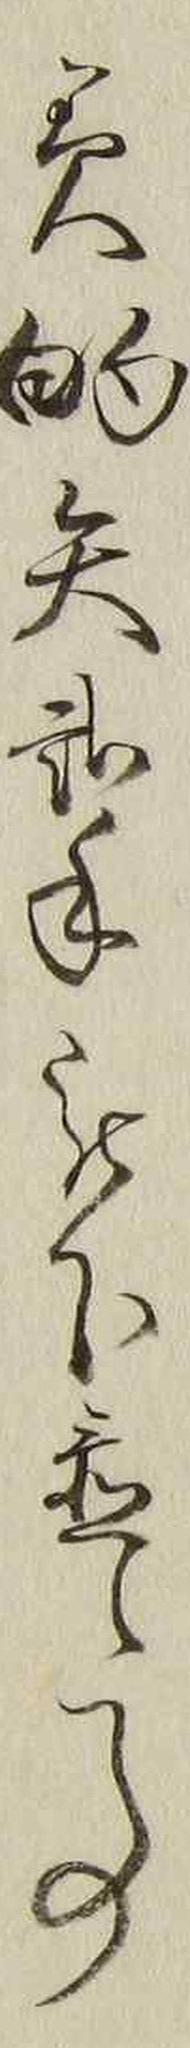美的矢弐手被下置候事
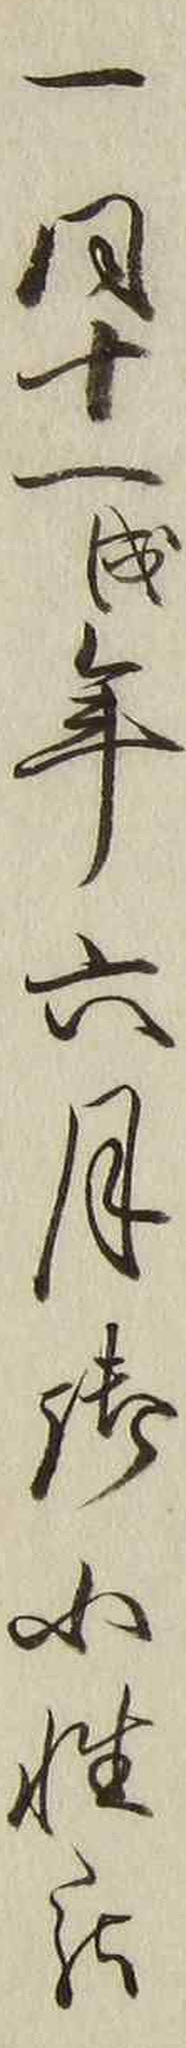一同十一戌年六月御小姓被
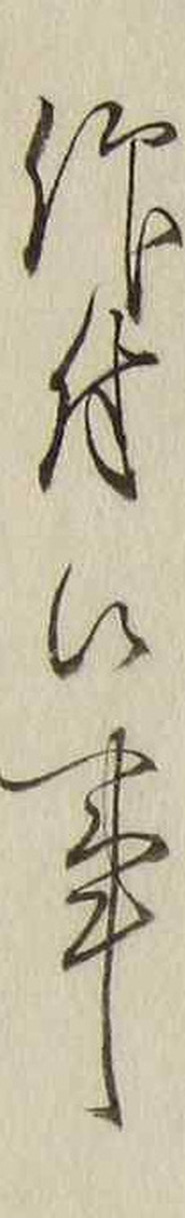仰付候事

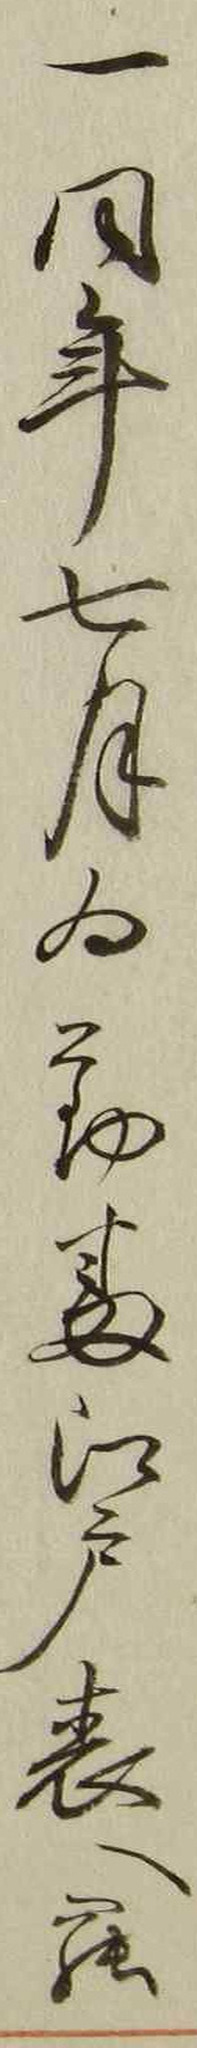一同年七月為勤番江戸表へ罷
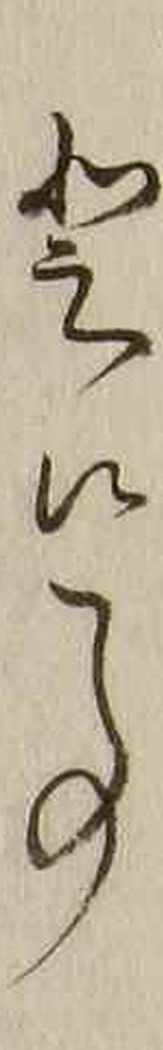登候事
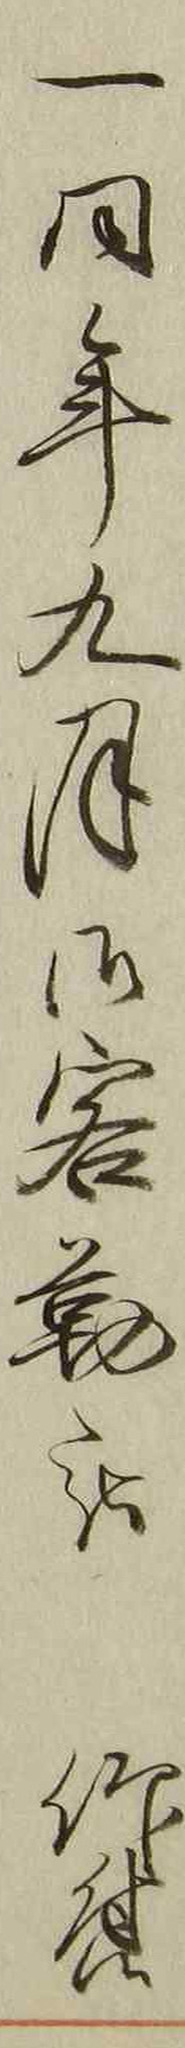一同年九月御客勤被仰付候
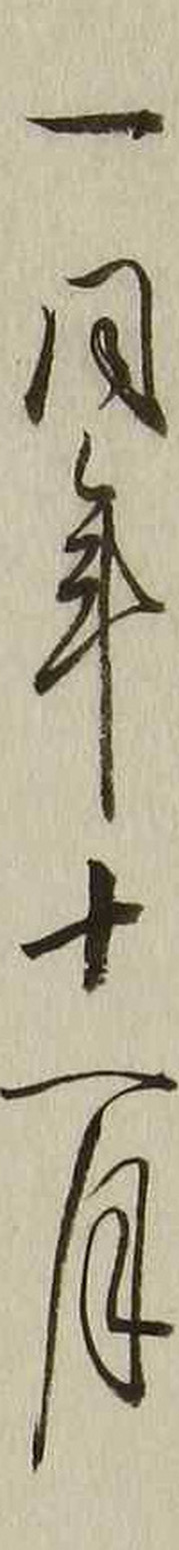一同年十一月
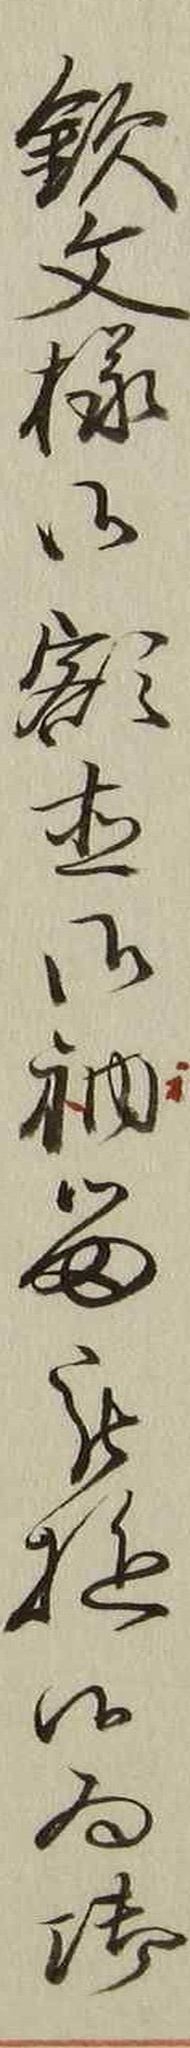欽文様御額直御衲留被遊候為御
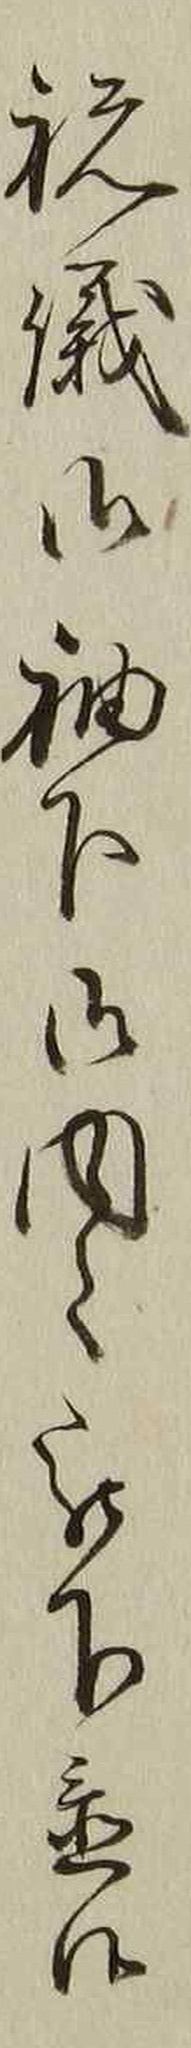祝儀御袖下御内々被下置候
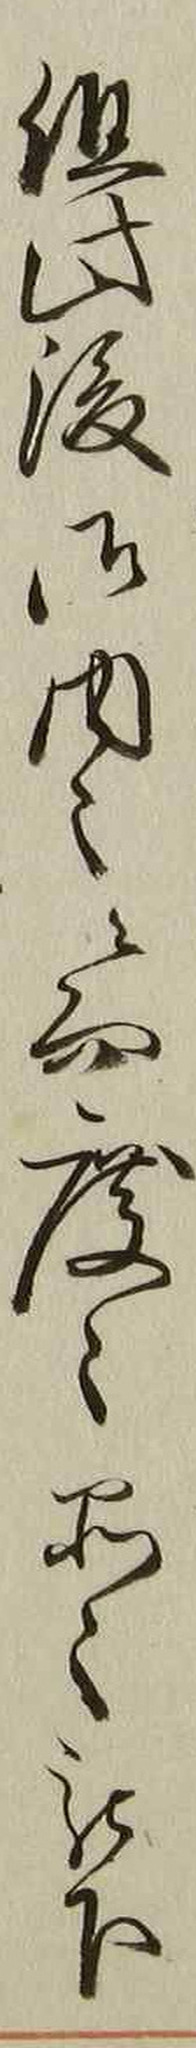但此後御内々ニ而度々品々被下
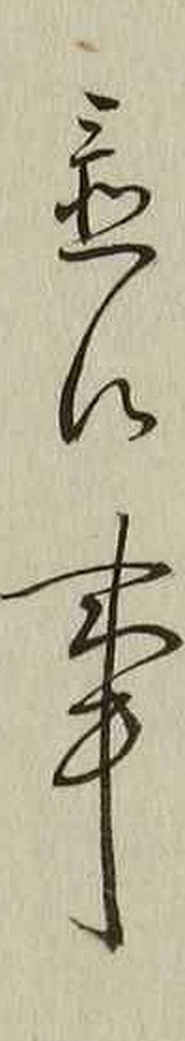置候事
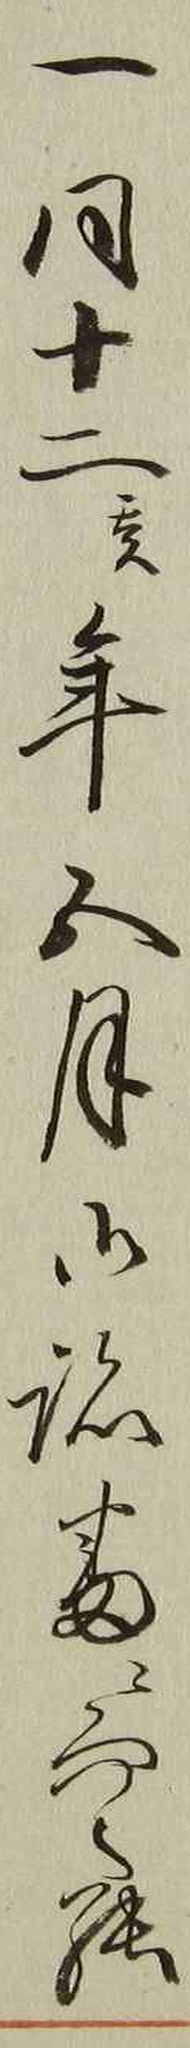一同十二亥年五月御諸番ニ而罷
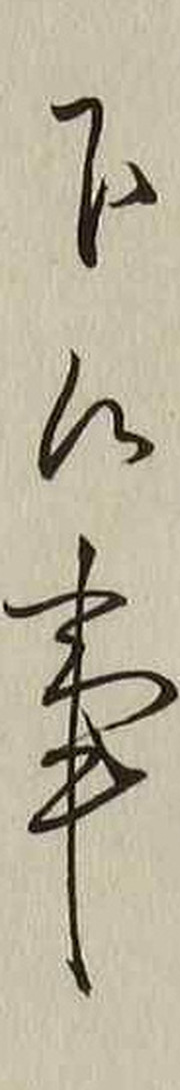下候事
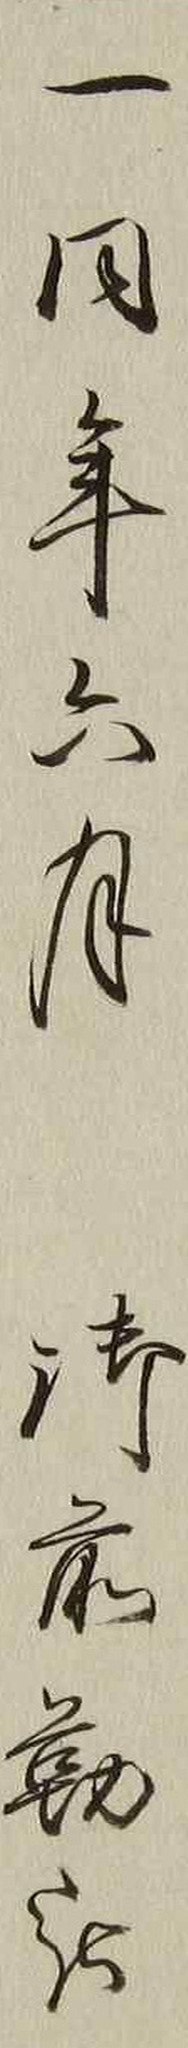一同年六月御前勤被
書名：諸士系譜　巻之54　ほ之部1
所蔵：会津若松市立会津図書館
